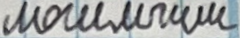могильник
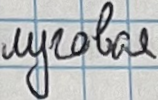луговая
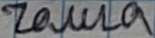чомга
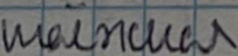таёжная
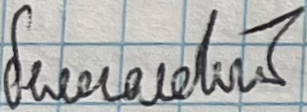белоголовый
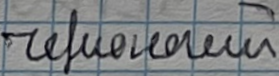черноногий
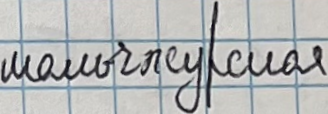маньчжурская
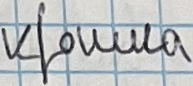крошка
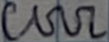сыч
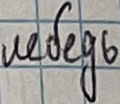лебедь
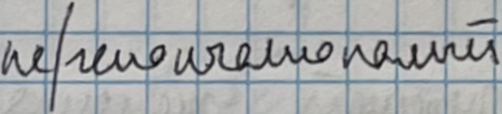перепончатопалый
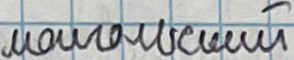монгольский
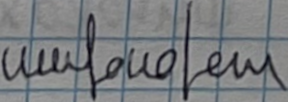широкорот
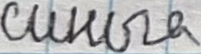синьга
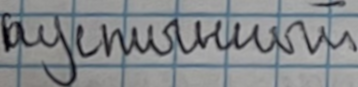пустынный
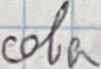сова
